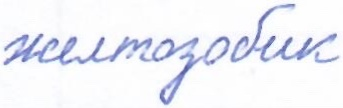желтозобик
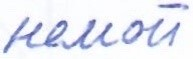немой
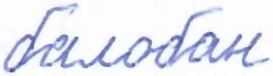балобан
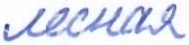лесная
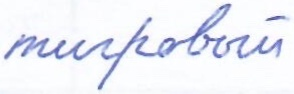тигровый
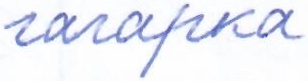гагарка
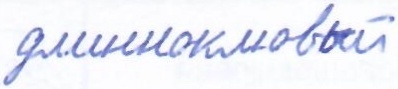длинноклювый
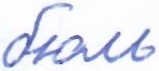бюль
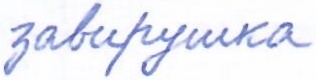завирушка
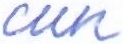сип
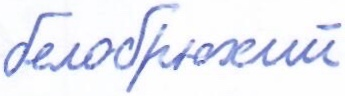белобрюхий
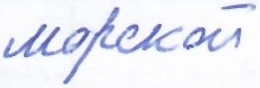морской
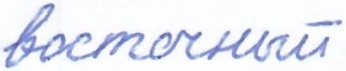восточный
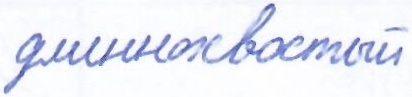длиннохвостый
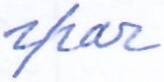грач
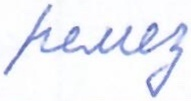ремез
